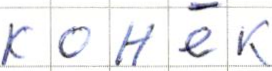конёк
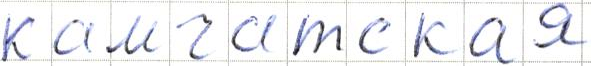камчатская
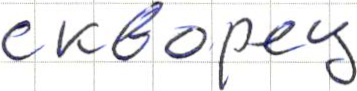скворец
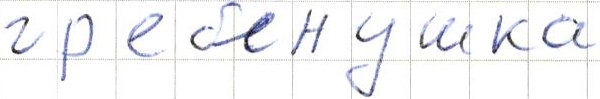гребенушка
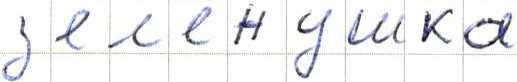зеленушка
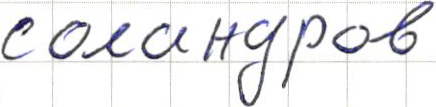соландров
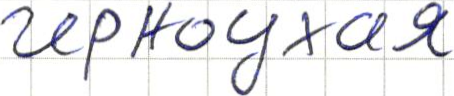черноухая
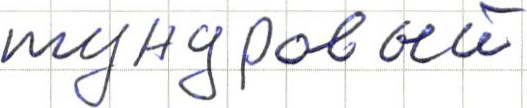тундровый
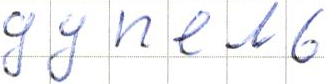дупель
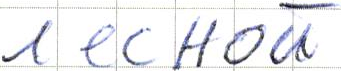лесной
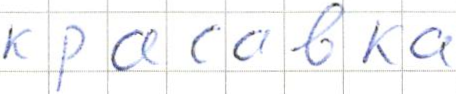красавка
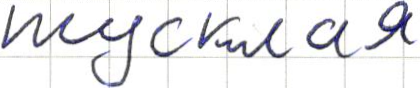тусклая
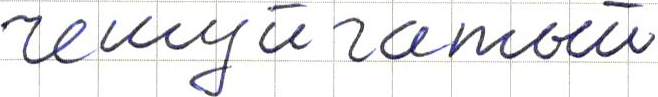чешуйчатый
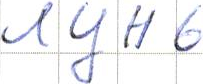лунь
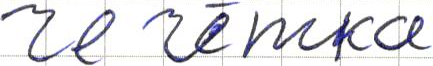чечётка
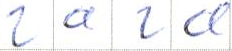гага
